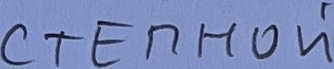степной
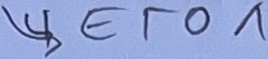щегол
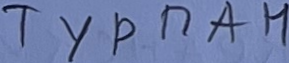турпан
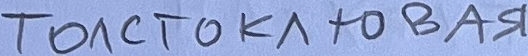толстоклювая
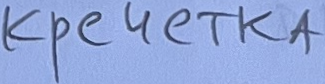кречетка
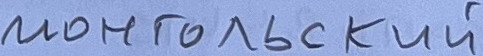монгольский
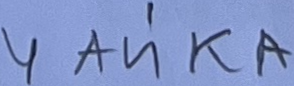чайка
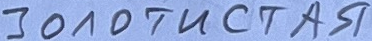золотистая
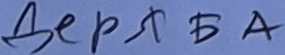деряба
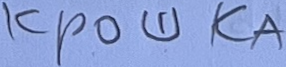крошка
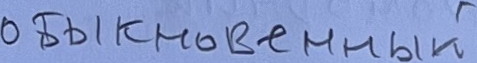обыкновенный
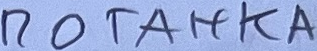поганка
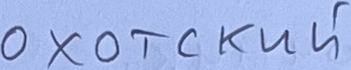охотский
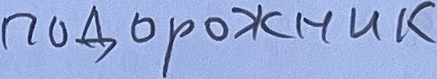подорожник
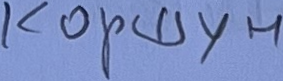коршун
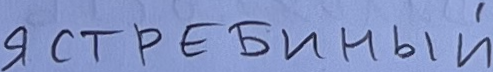ястребиный
